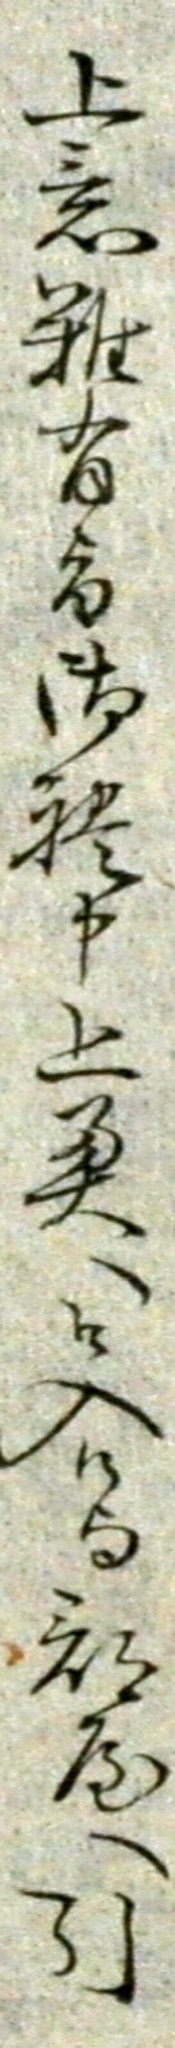上意難有旨御禮申上奥へ被入候与部屋へ引
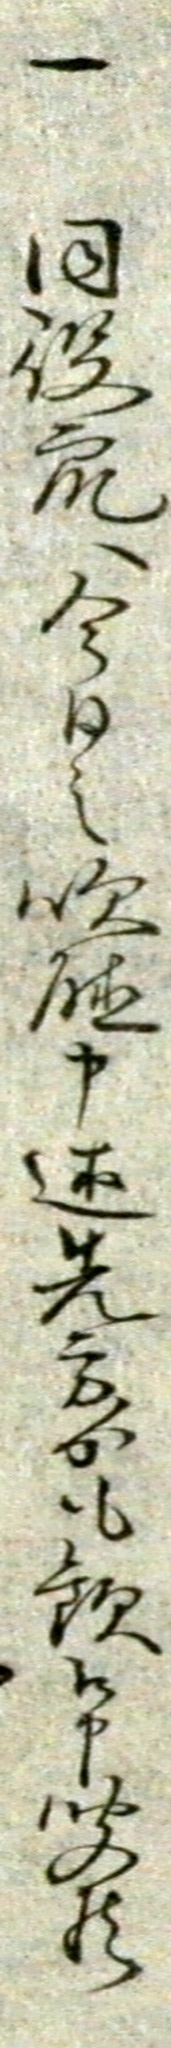一同役衆へ今日之吹聴申述先方ゟも歓被申聞候
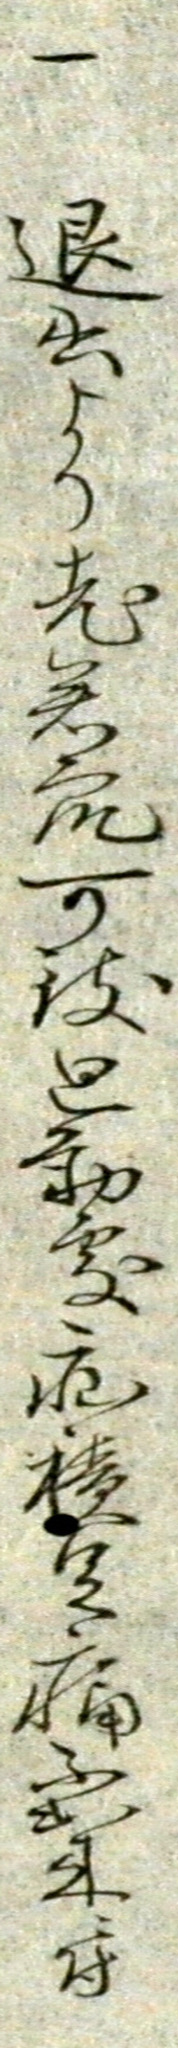一退出より老若衆可致廻勤処疱積足痛不出来ニ付
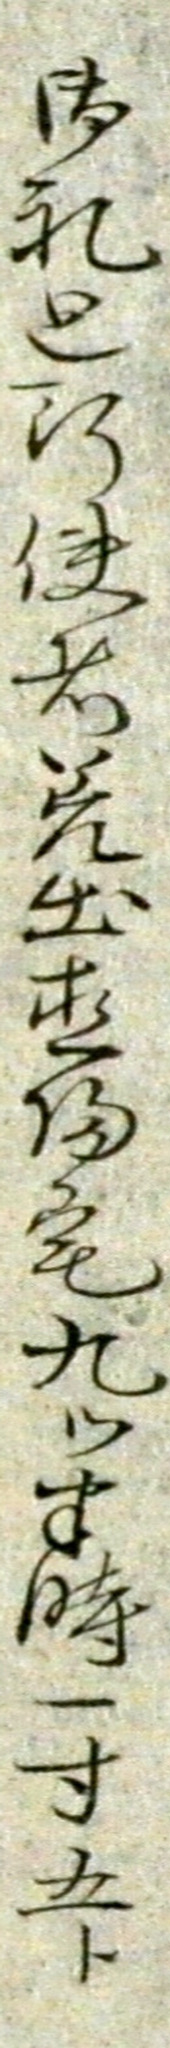御礼廻断使者差出直帰宅九ツ半時一寸五ト

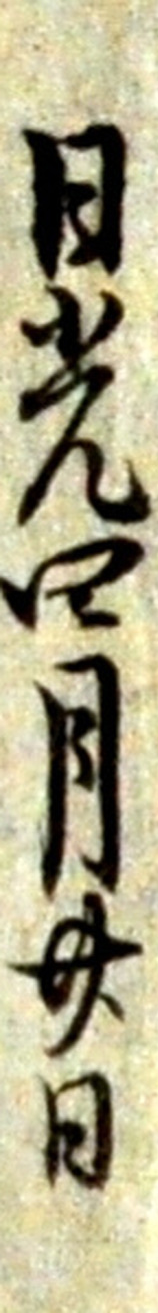日光四月廿日
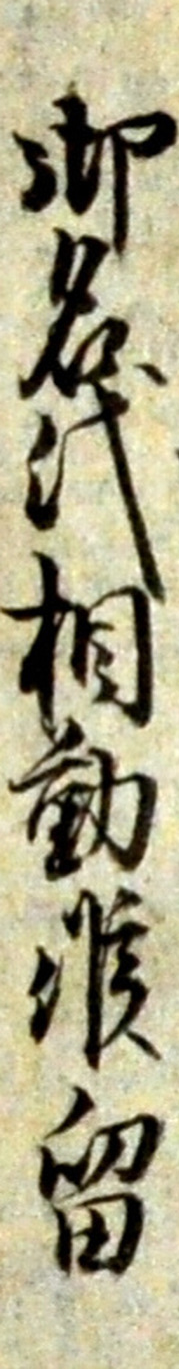御名代相勤候留
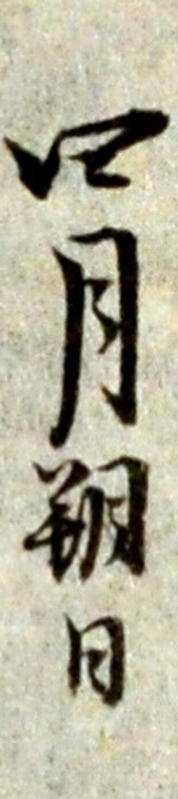四月朔日
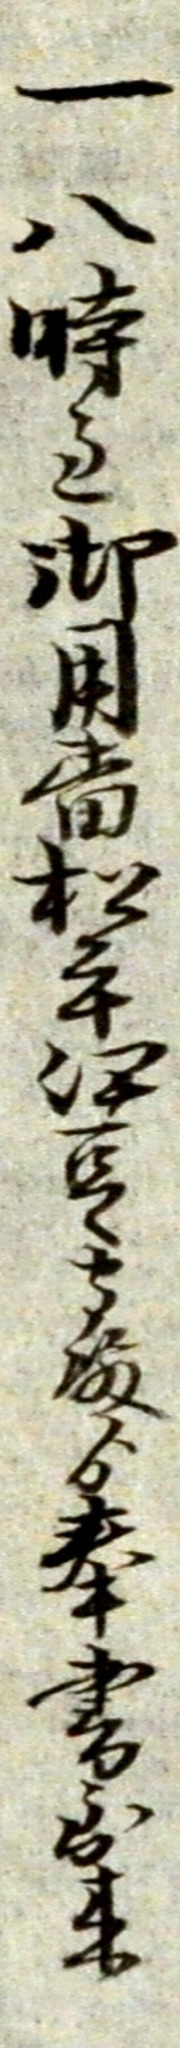一八時過御用番松平伊豆守殿ゟ奉書到来
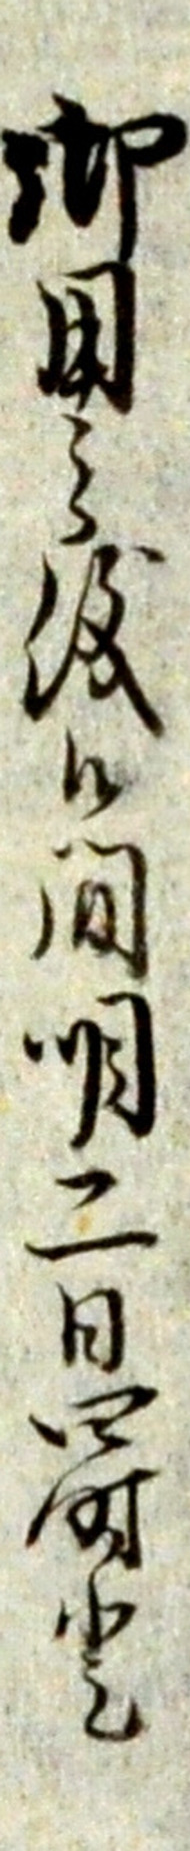御用之儀候間明二日四時登
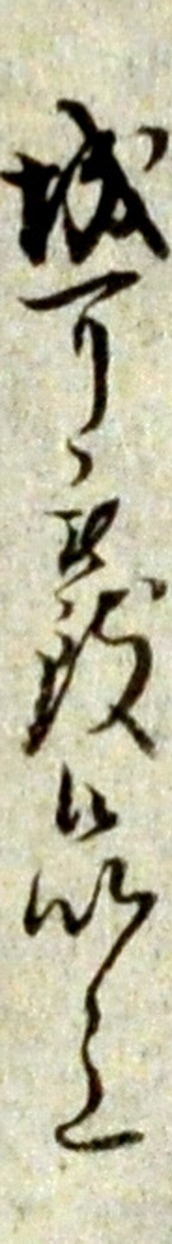城可被致候以上
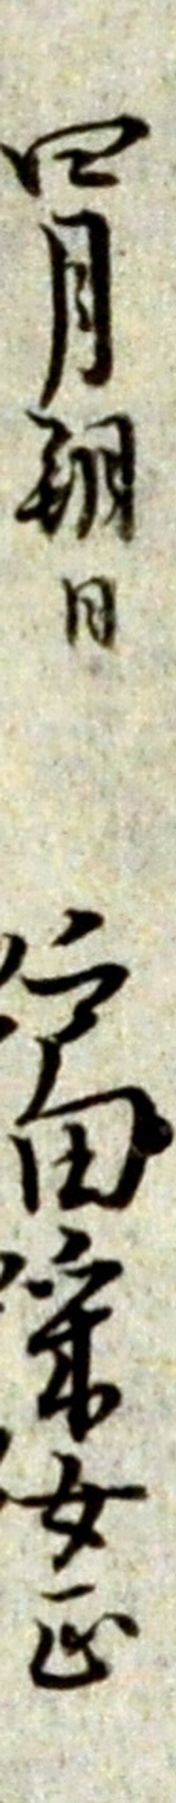四月朔日戸田采女正
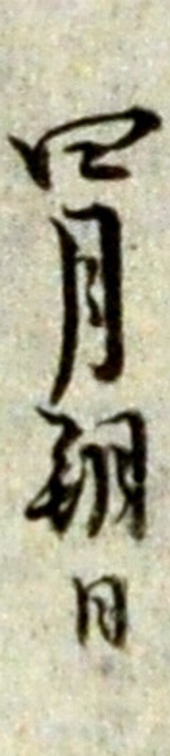四月朔日
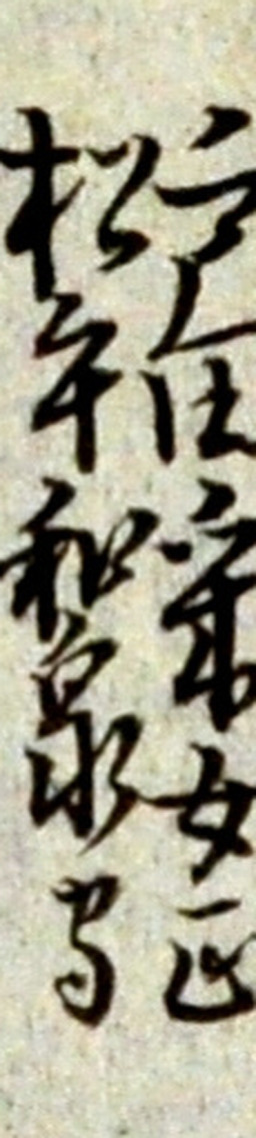松平和泉守
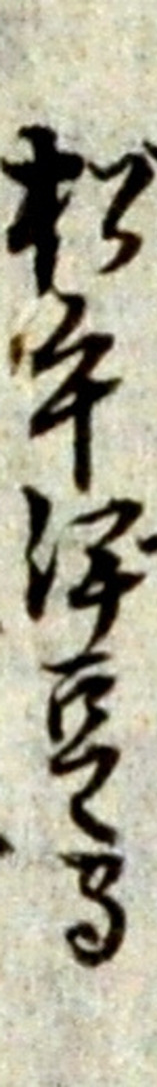松平伊豆守
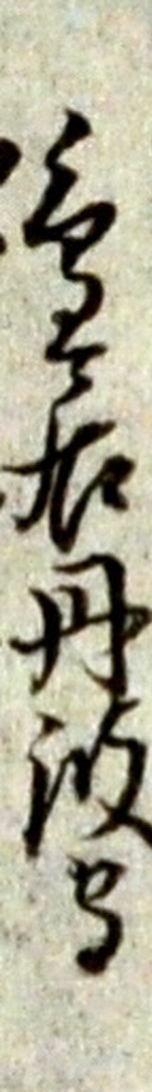鳥居丹波守
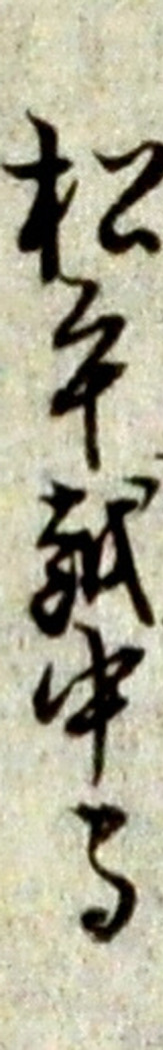松平越中守
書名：日光御名代相勤候節ノ留
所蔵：伊那市立高遠町図書館・合同会社AMANE
